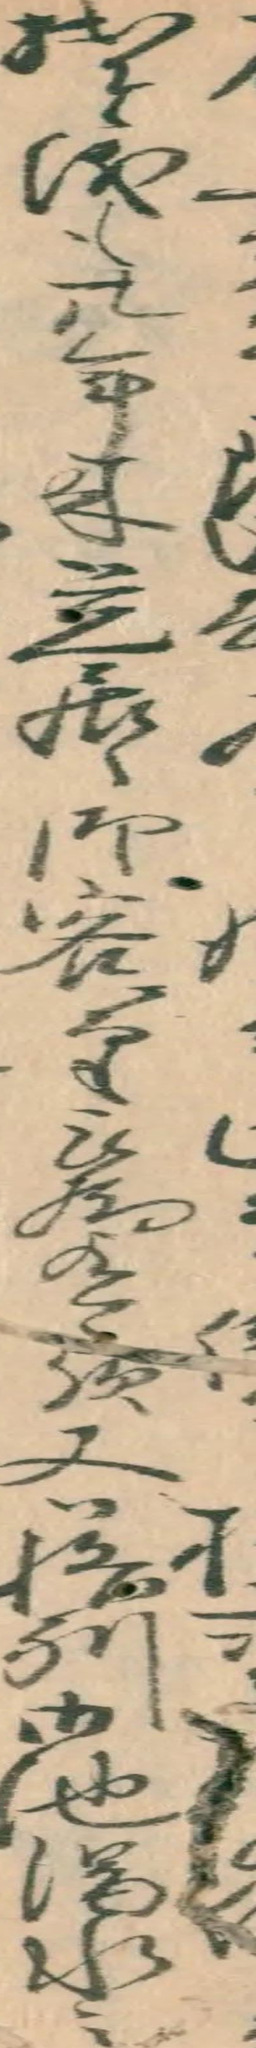拙者儀も廿年来覚居候御客ニ而も被為有候歟又ハ格別御池渇水之
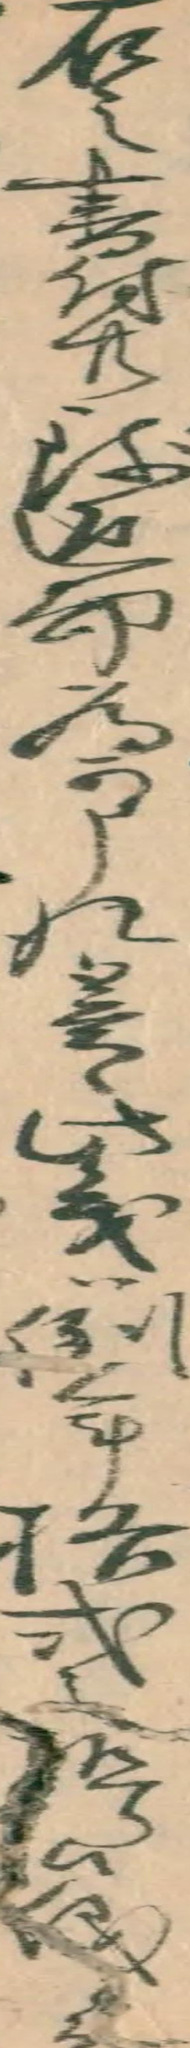右之書付共致返却為可申得御意候此義ハ例年格式之極り候儀ニ而
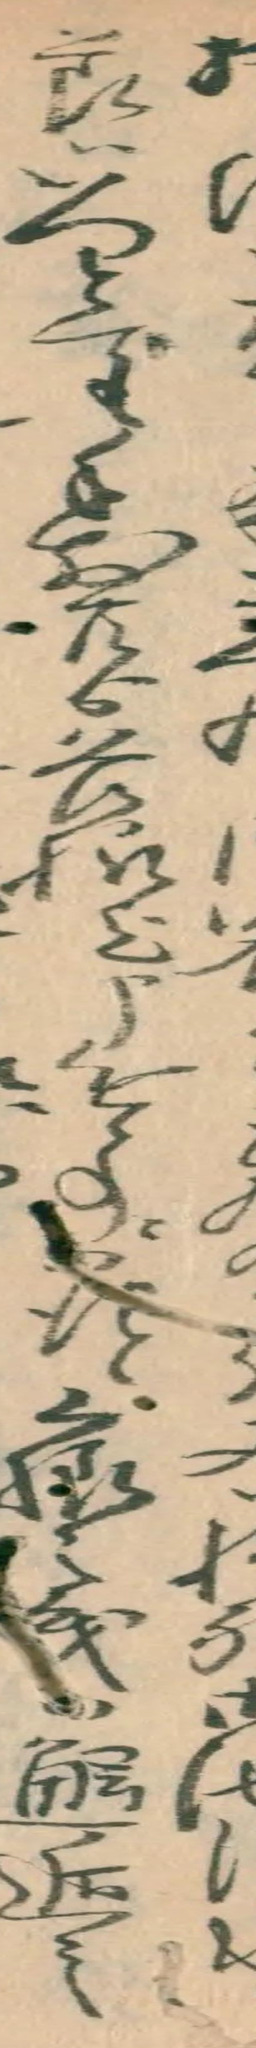節ハいつとても手前共ゟ各様迄申進候事ニ御座候ケ様之義ハ邂逅之
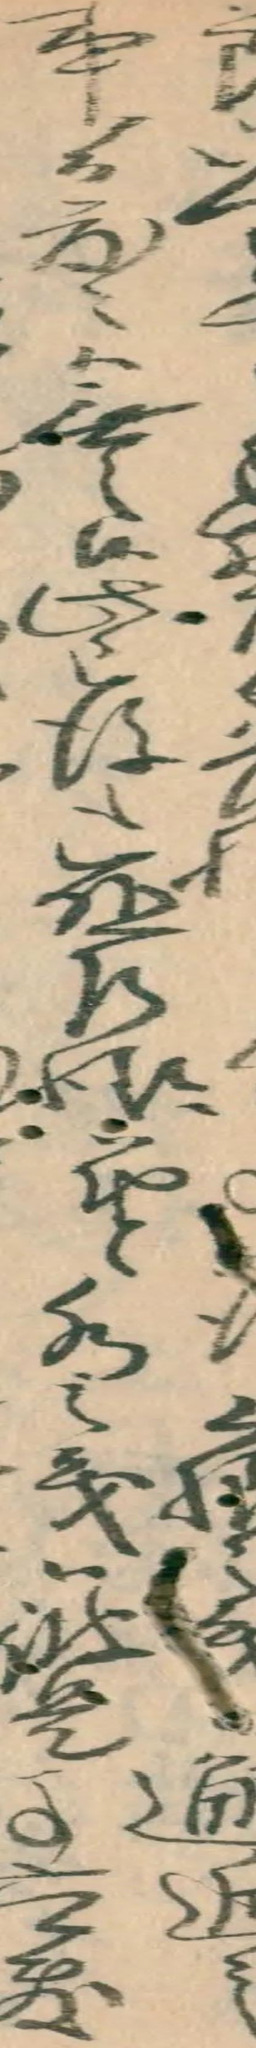事ニ而度々ハ無之候此已後も愈左様ニ御座候水之義ハ彼是事六ケ敷
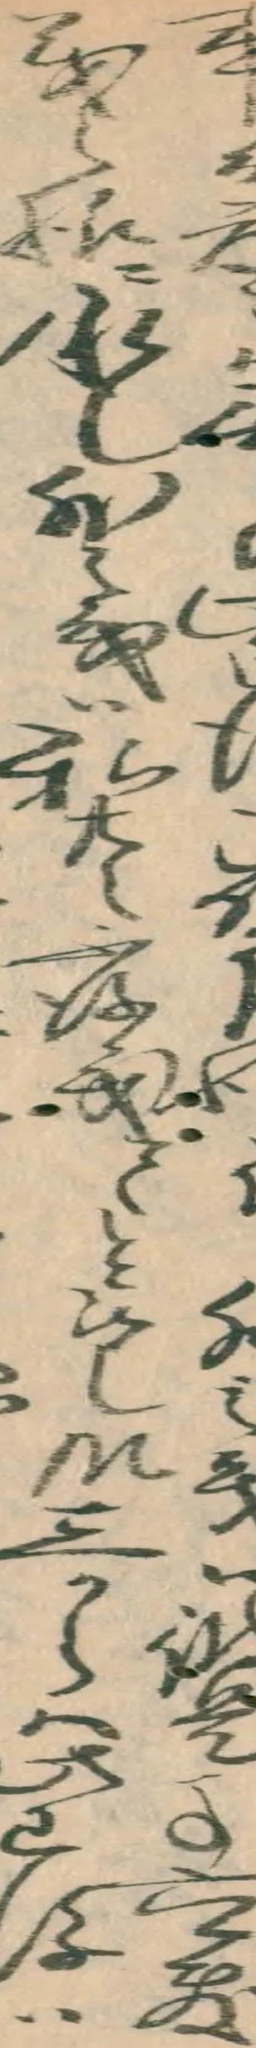義候様ニ承候外之義ハ私共之不存義ニ候と被申候故しからハ此已後ハ
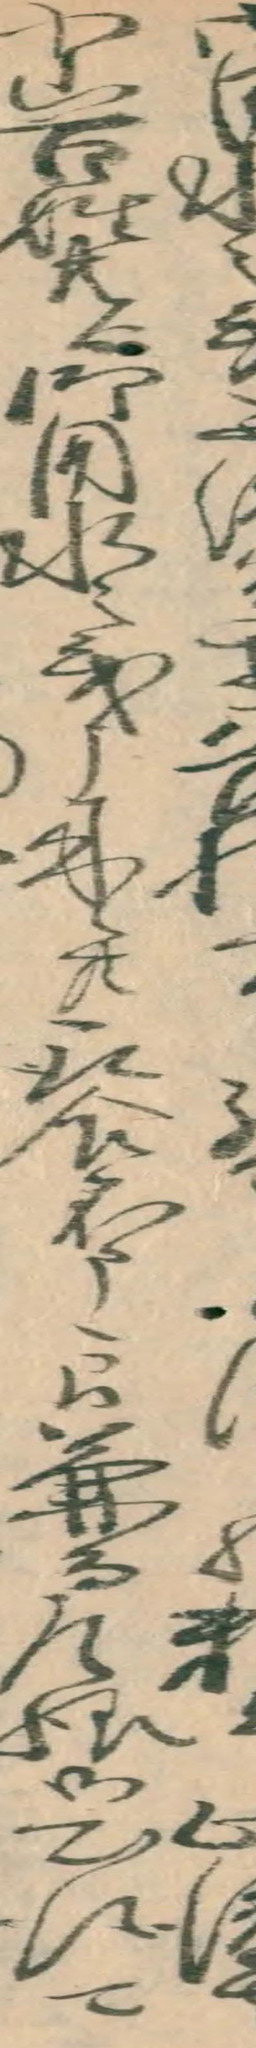小山百姓共ゟ御用水之義申来候共取合不申候間兼而左様御心得可
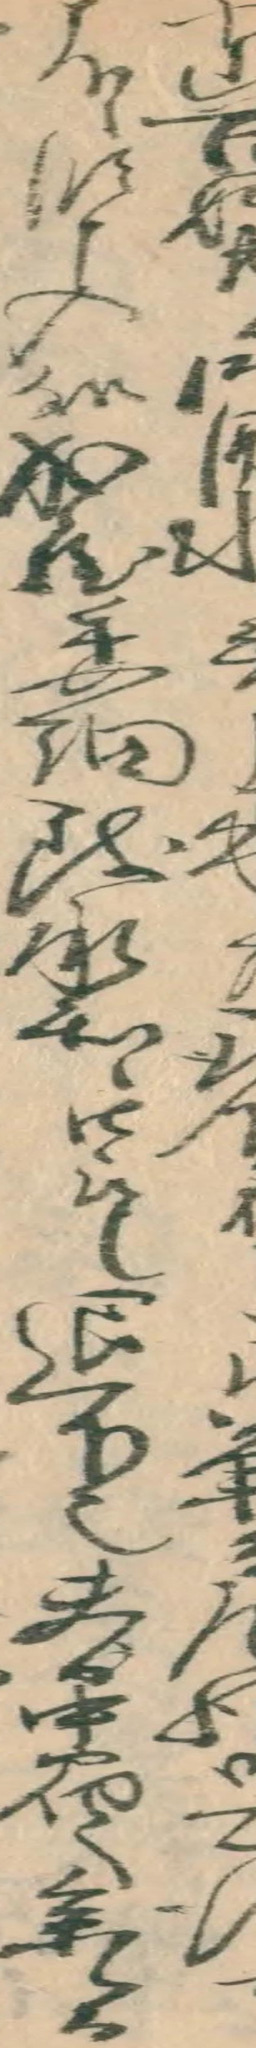被下候段申入処成程委細致承知候由被申候退下也夫ゟ中宿へ参候而
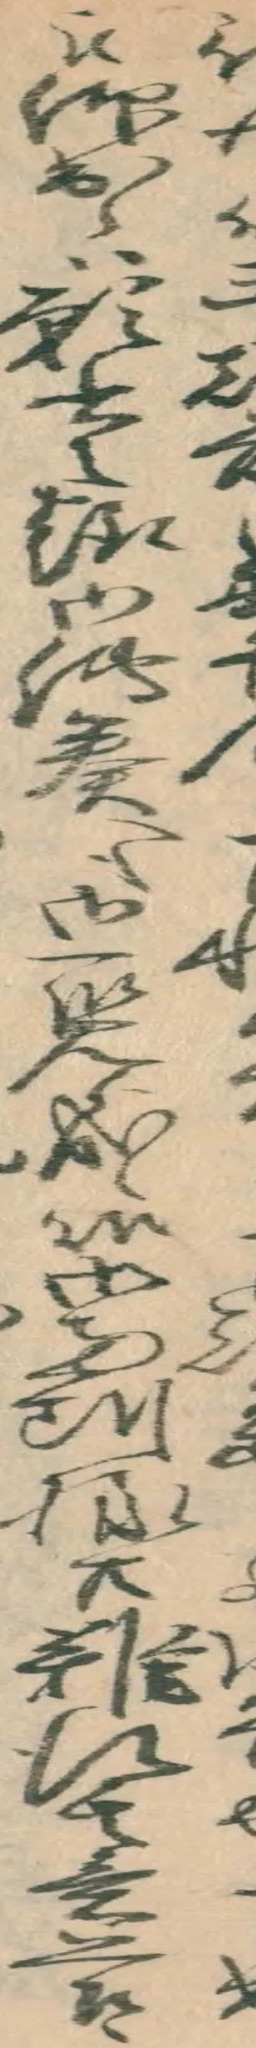被仰出候ハ願書之趣御伝奏へも御一覧被成候処御両所様共難得其意思召候
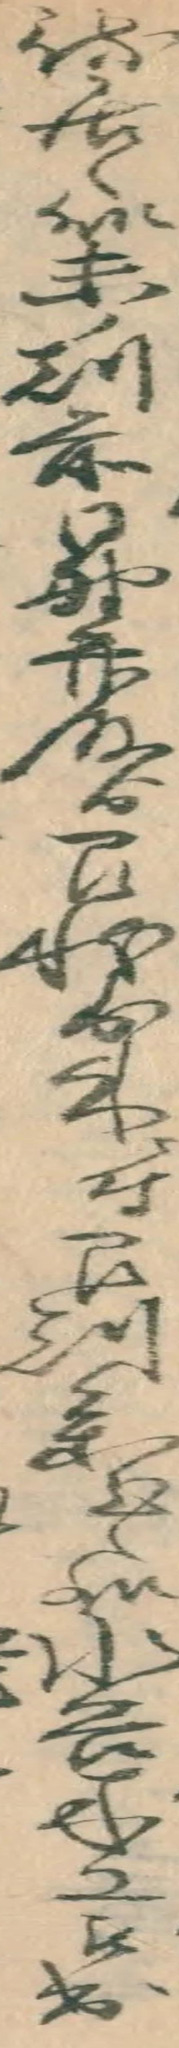待居候処未ノ刻前日野弁殿ゟ召状到来ニ付即刻参上候処水谷木工被出
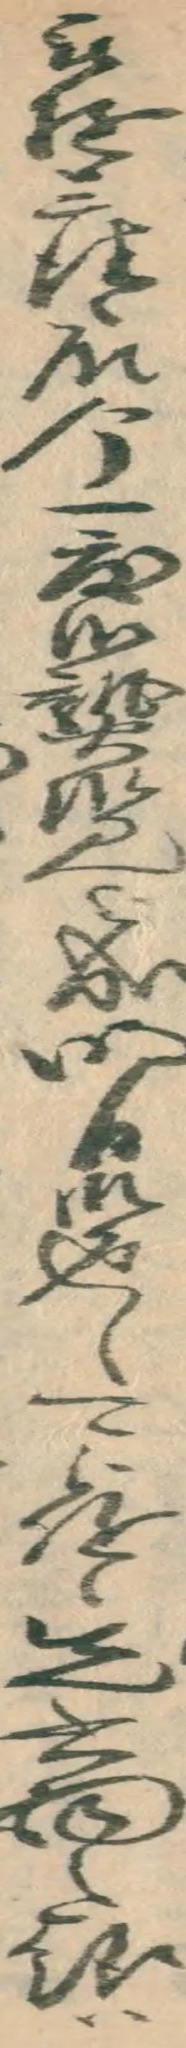被遊御座候故今一度御熟覧被成明日御返し可被遊候先書物之趣ハ
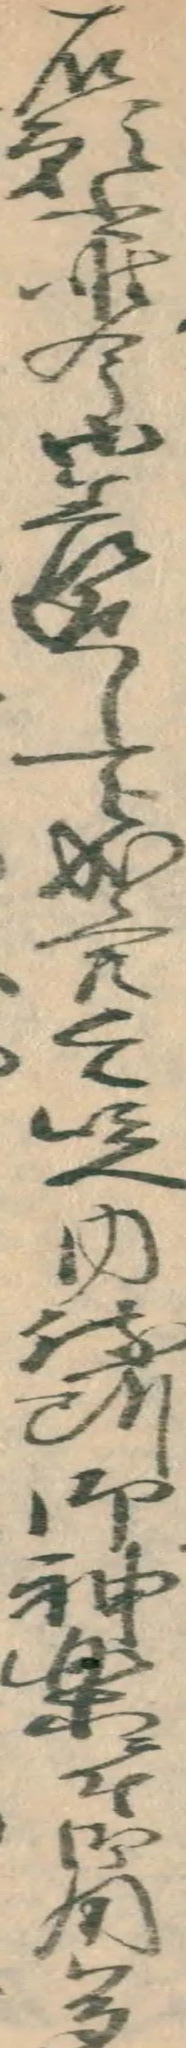右願書唯今御差返し可被成候へ共今晩内侍所御神楽ニ付御用多
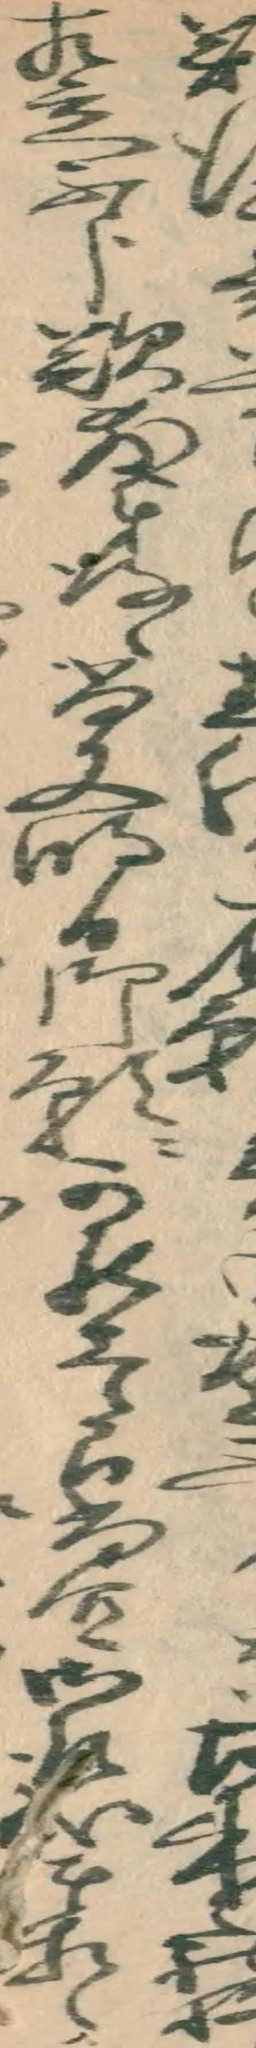相立不申歎敷奉存候尚又明日御願ニ可罷在候間尚宜御取奉願候
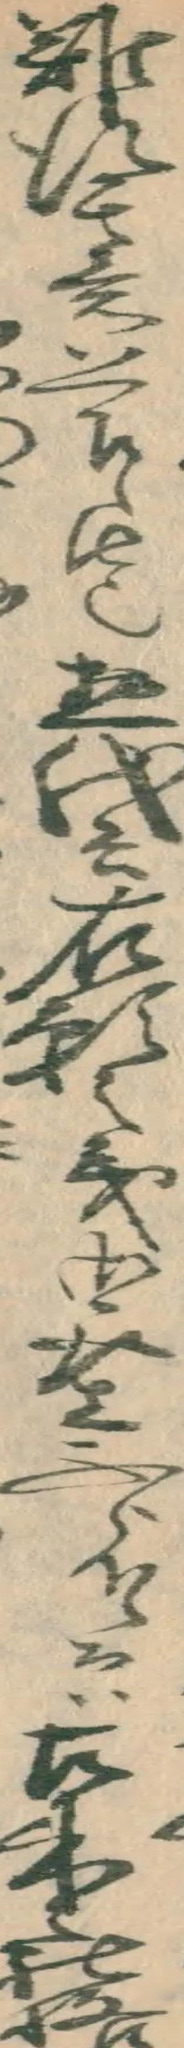難得其意思召候由也惣代共右願之義御取上不被下候而ハ古来之社格
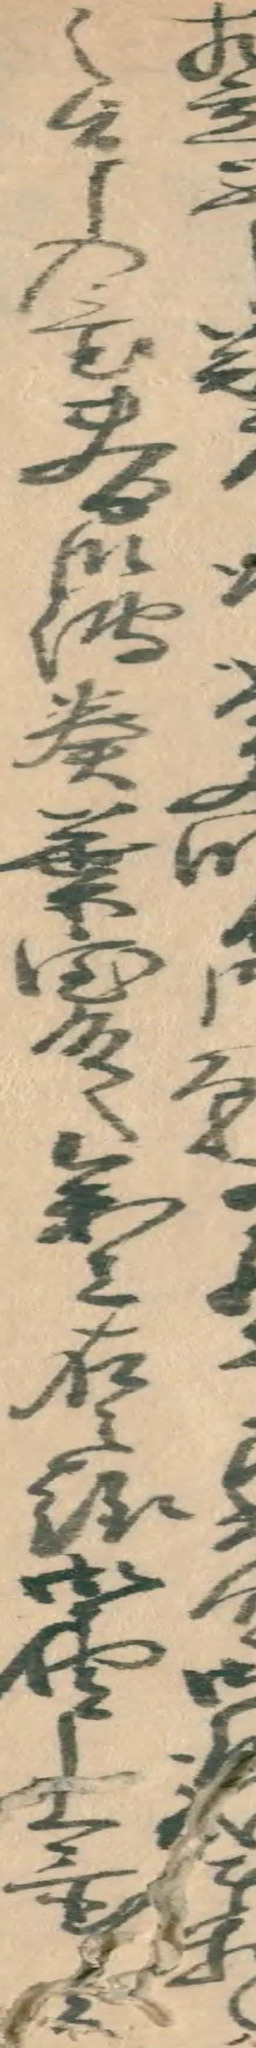之旨申入置夫ゟ御伝奏葉室殿へ参上右之趣御届申上置候而
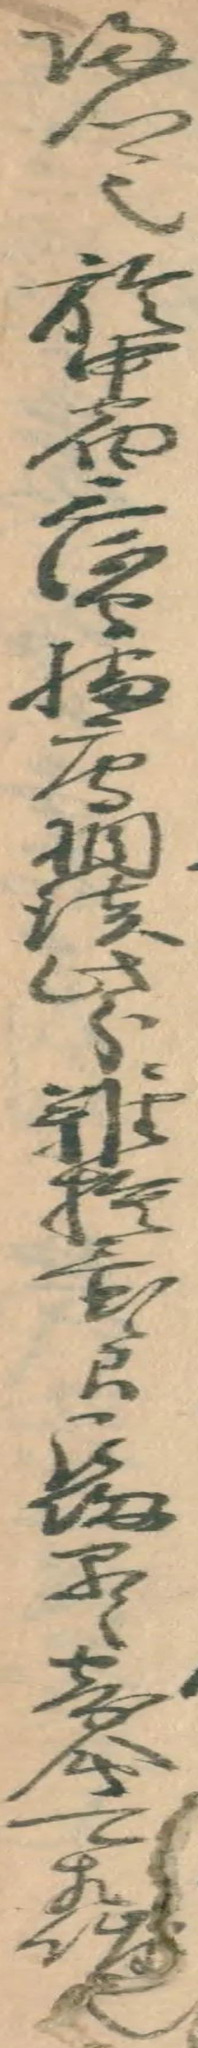帰郷也於中宿三河守播磨守相談此分ニ難捨置候間罷帰早々寄会可相催也
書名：賀茂社記録. 第58冊
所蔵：国立国会図書館 National Diet Library, JAPAN
